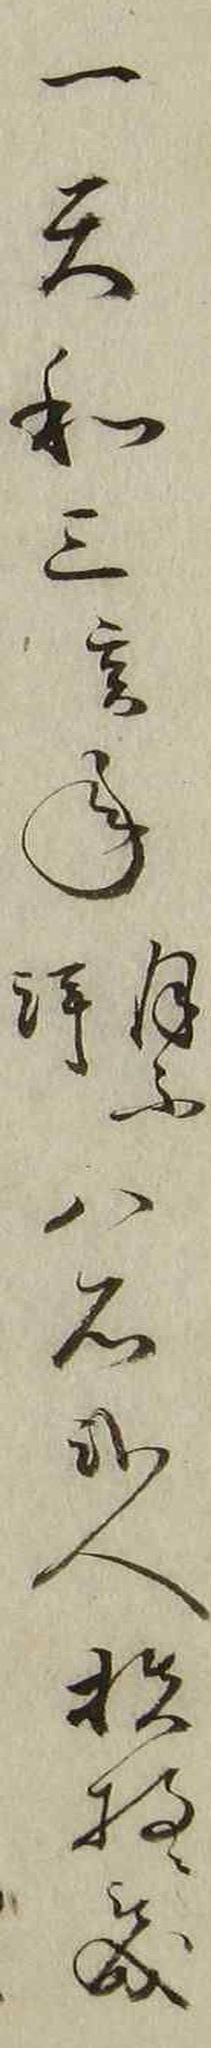一天和三亥年月不詳八石弐人扶持ニ被成
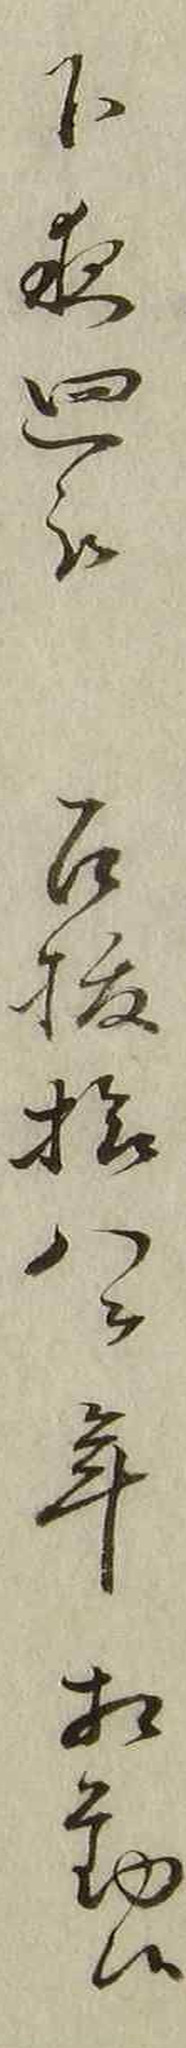下夜廻被召抜拾八ケ年相勤候
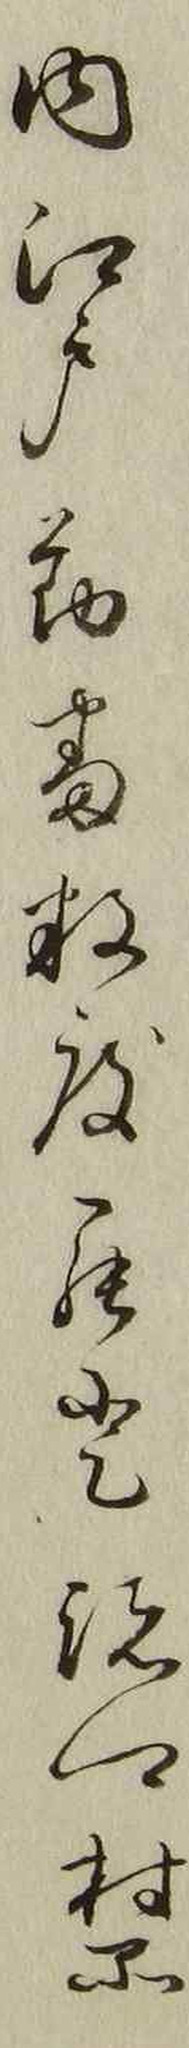内江戸勤番数度罷登諸郷村品
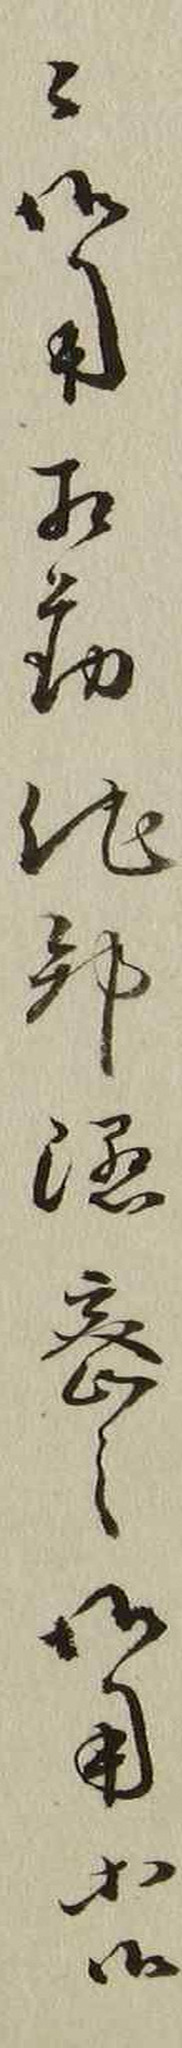々御用相勤他邦隠密之御用等御
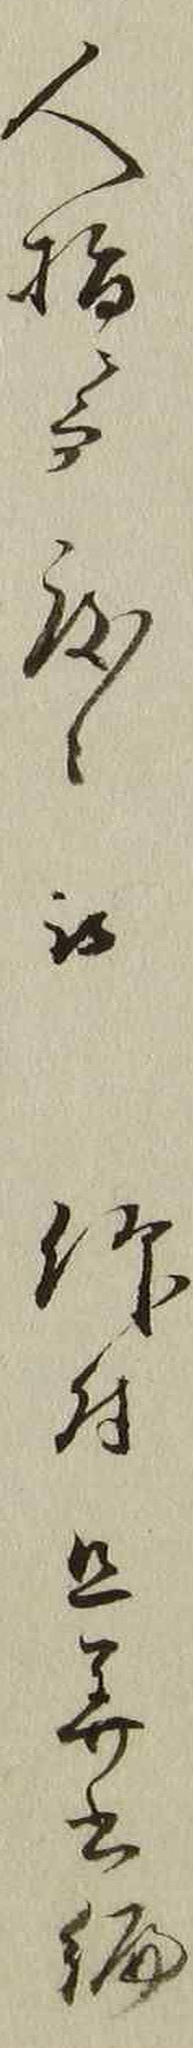人指ニ而度々被仰付且算書編
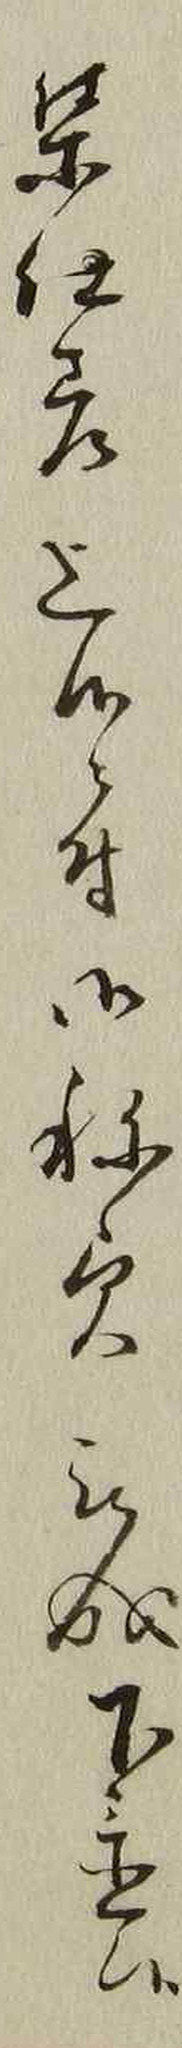集仕差上候ニ付御称美被成下置候
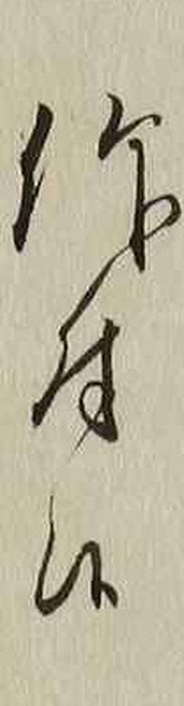仰付候
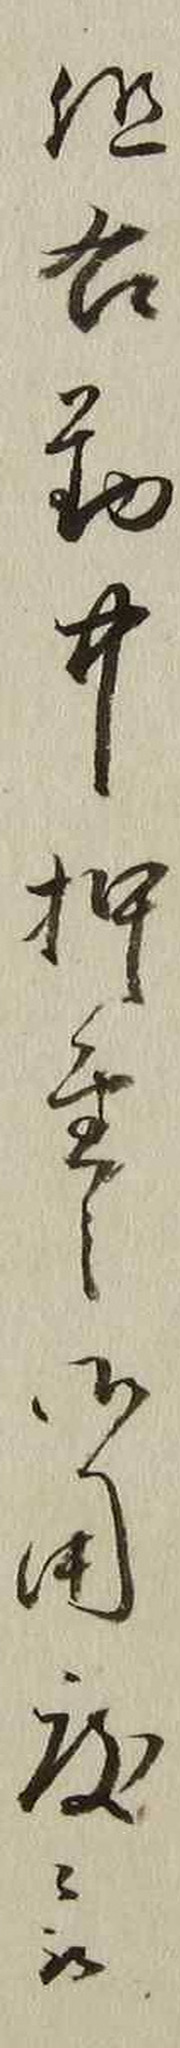但右勤中押金之御用度々被
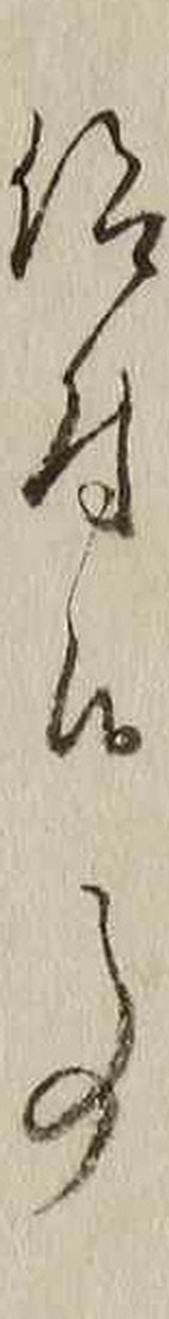仰付候事
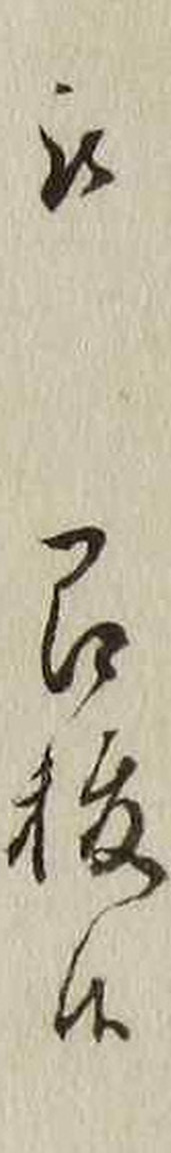被召抜候
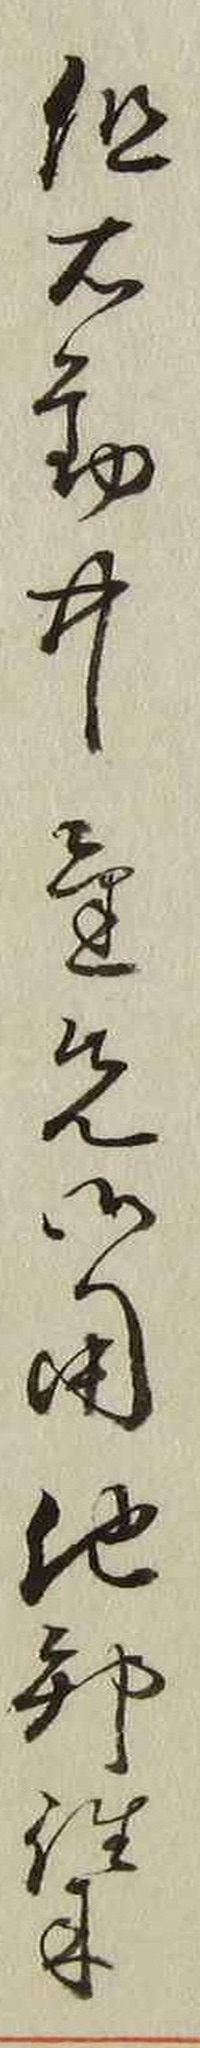但右勤中金先御用他邦往来
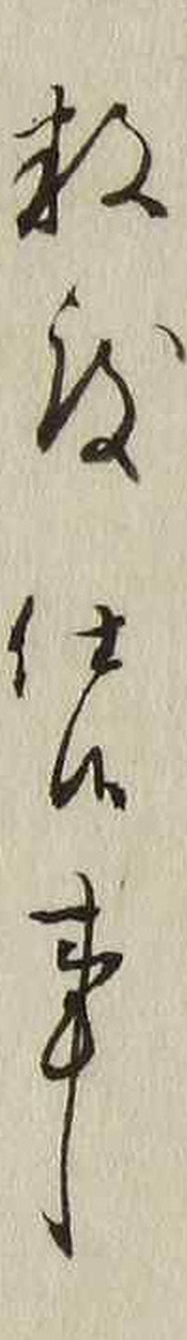数度仕候事
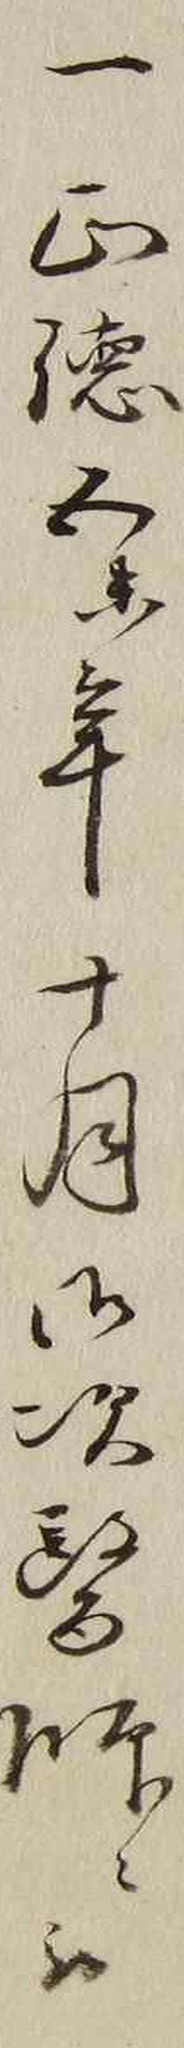一正徳五未年十月御次医師ニ被
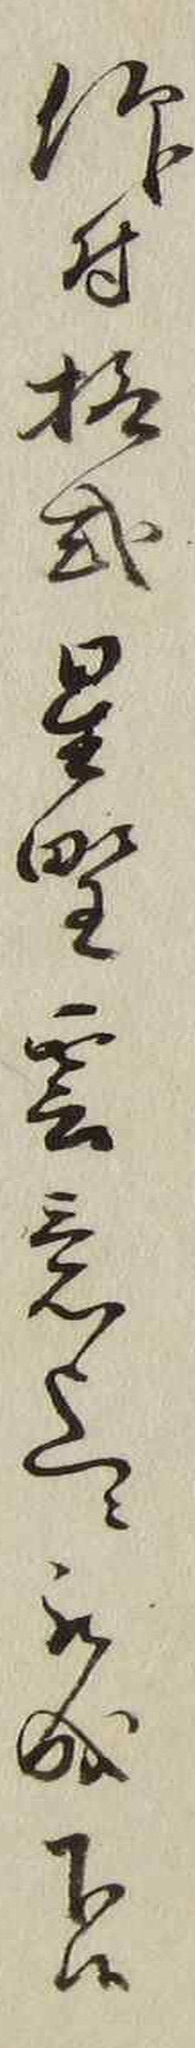仰付格式星野雲意上ニ被成下候
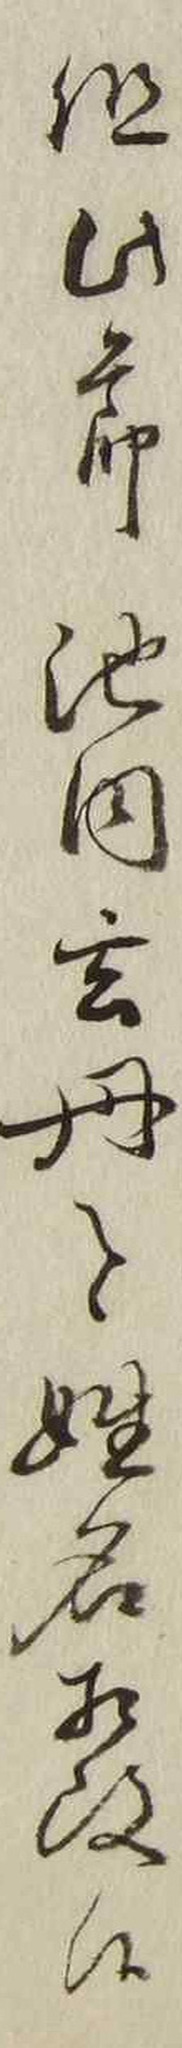但此節池内玄丹と姓名相改候

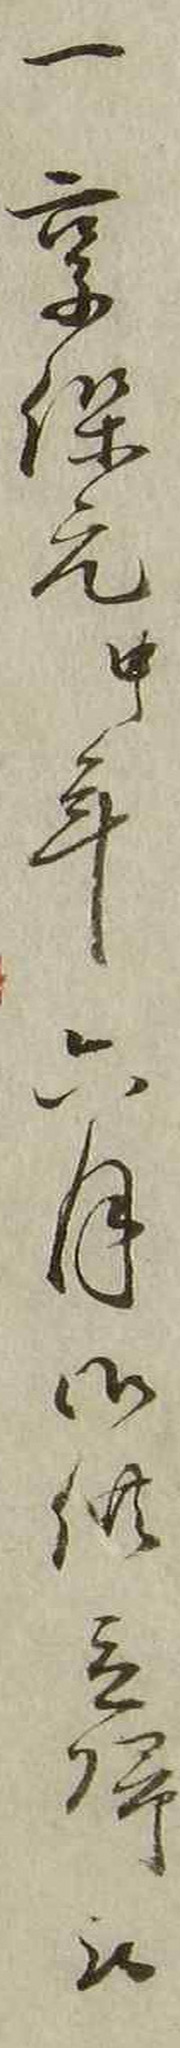一享保元申年六月御供立帰被
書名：諸士系譜　巻之8　い之部8
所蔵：会津若松市立会津図書館
